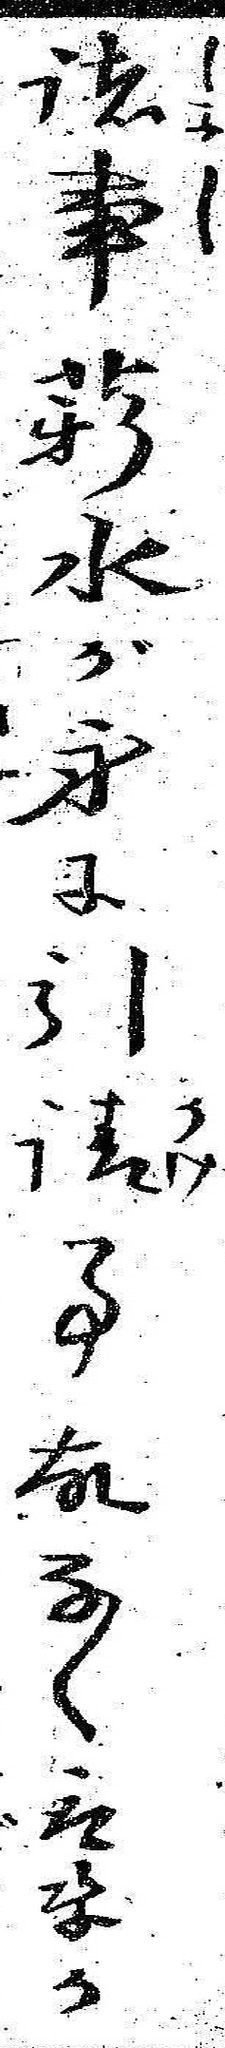諸事薪水が身に引請事故なく取まか
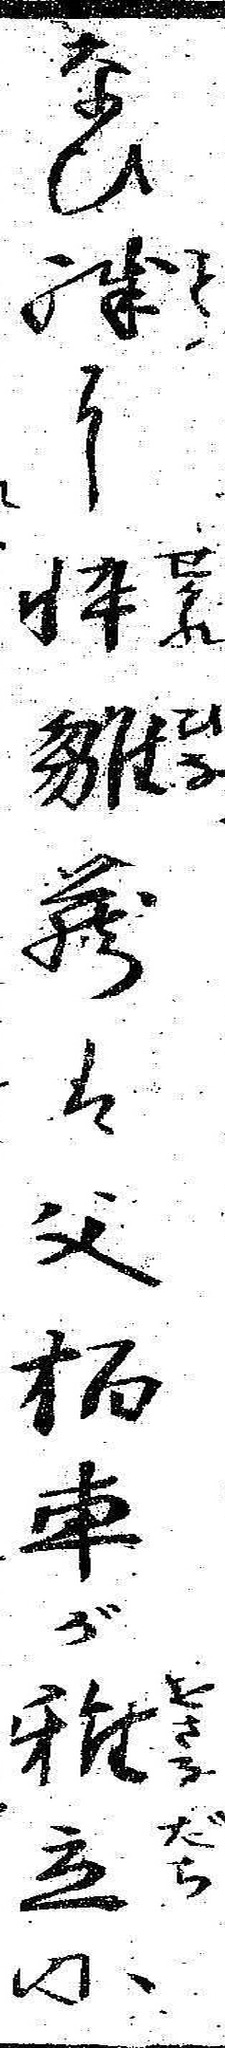なひ殊に忰雛蔵は父栢車が稚立に
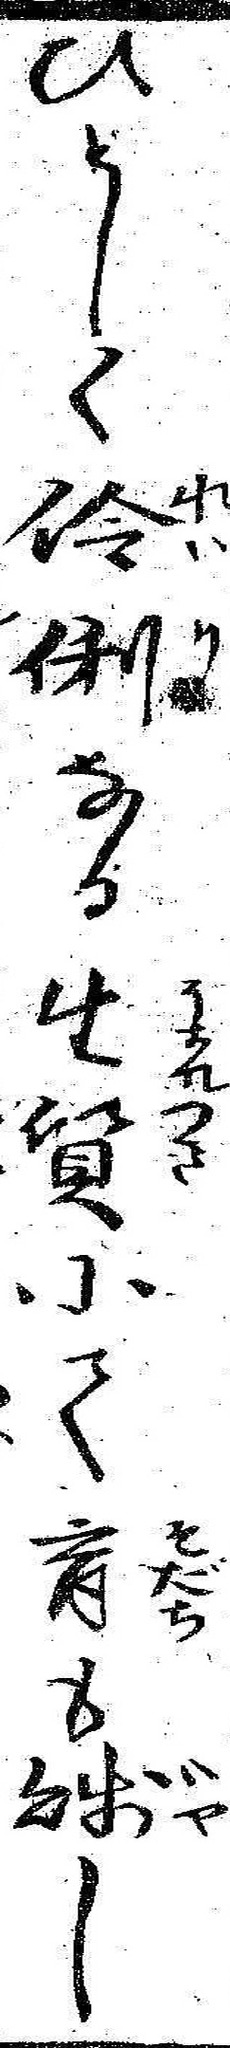ひとしく怜俐なる生質にて育も賎し
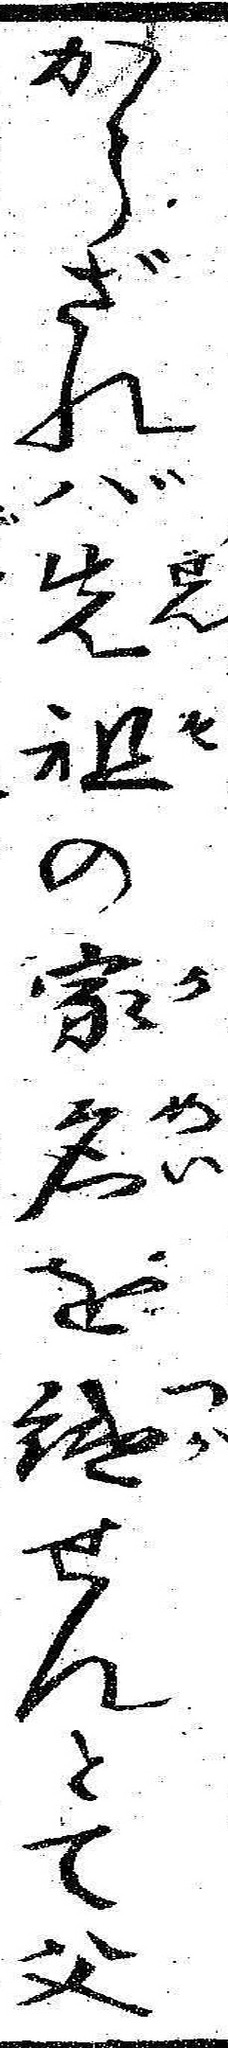からざれば先祖の家名を継せんとて父
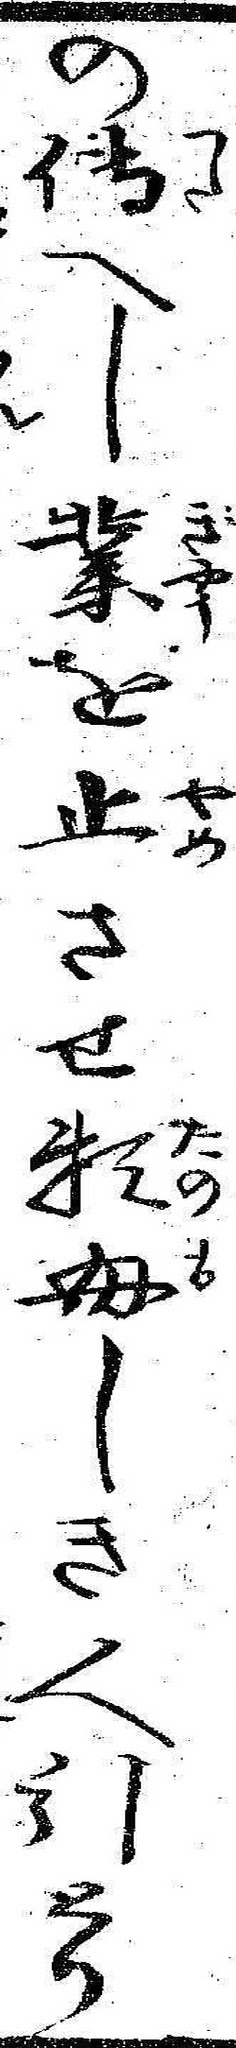の伝へし業を止させ頼母しき人引とり
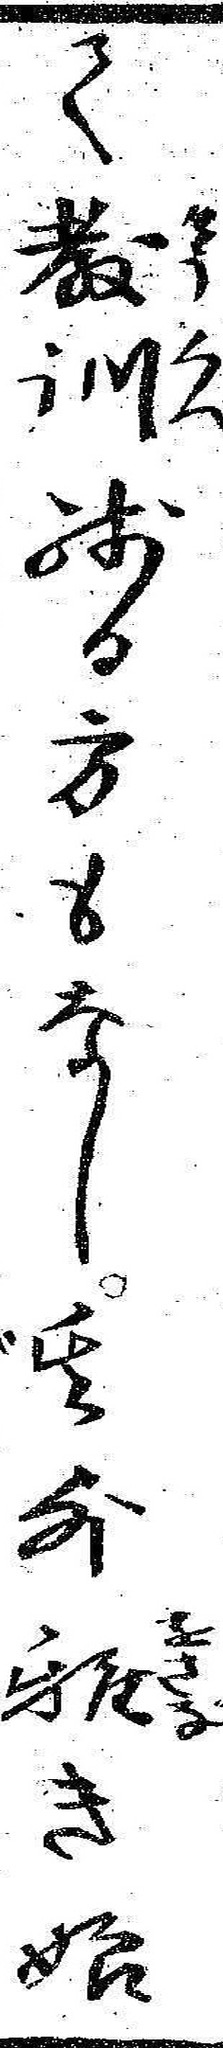て教訓残る方もなし其外稚き娘
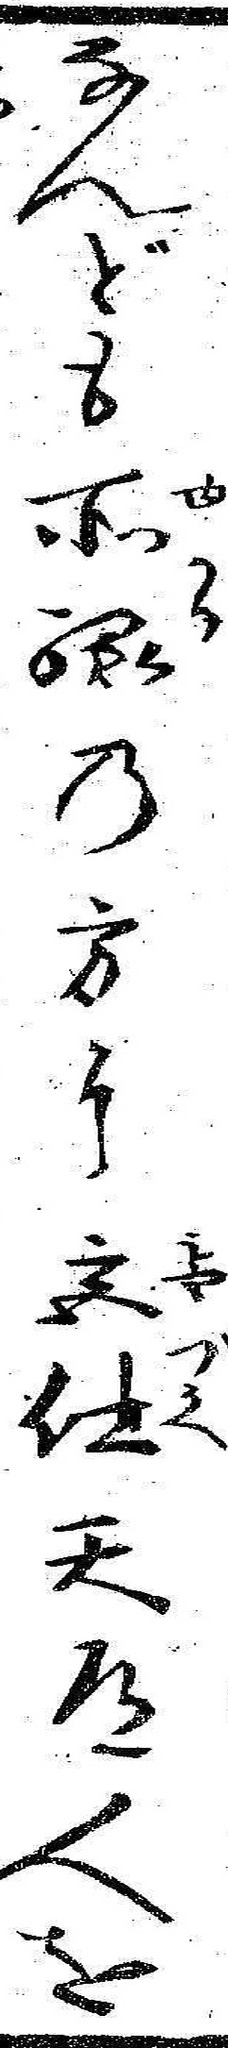なんども所縁の方に宮仕天道人を
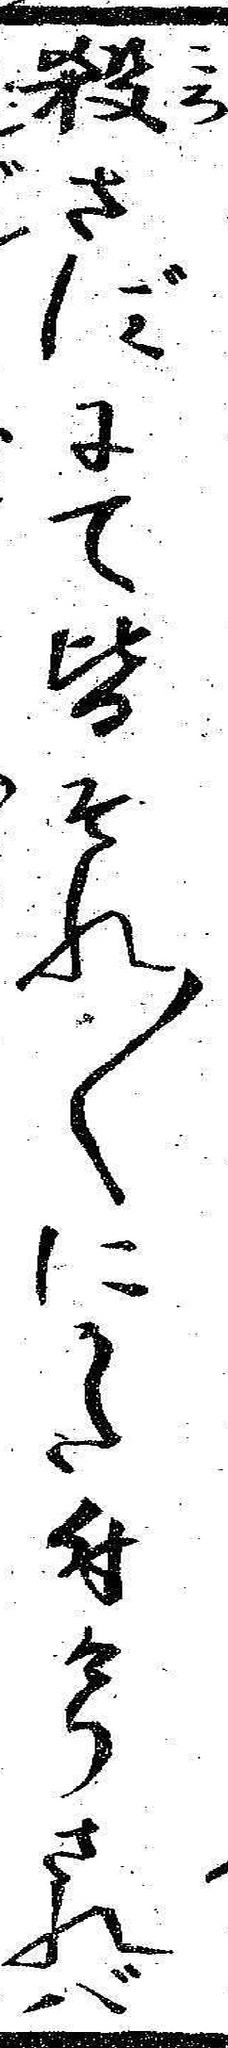殺さずにて皆それ〱にかた付けりされば
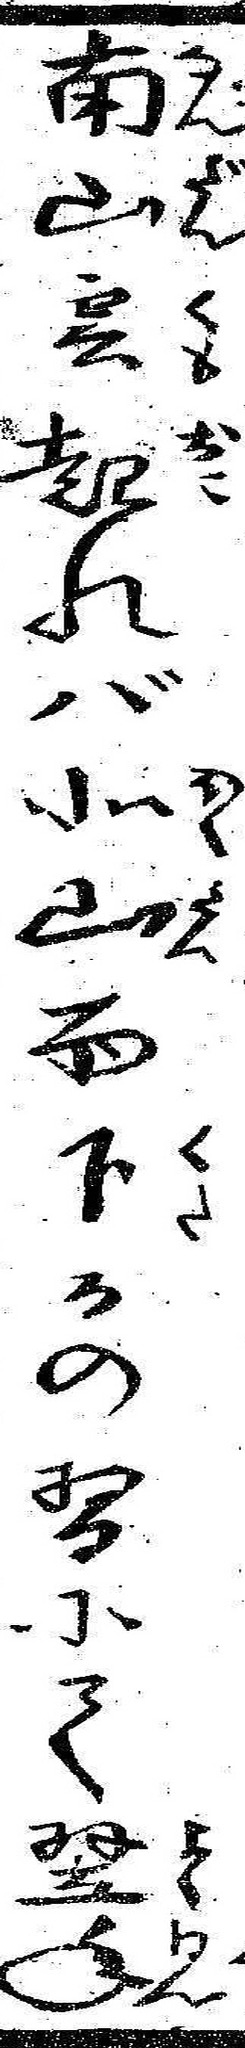南山雲起れば北山雨下るの習にて翌年
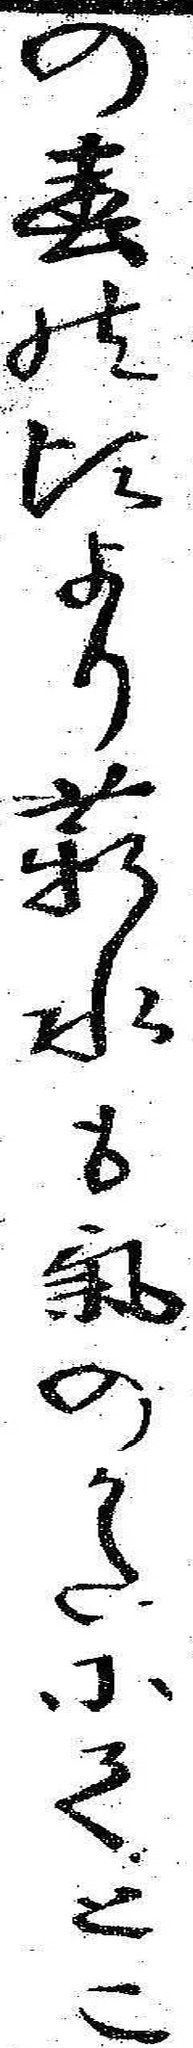の春の頃より薪水も気のかたにてとこ
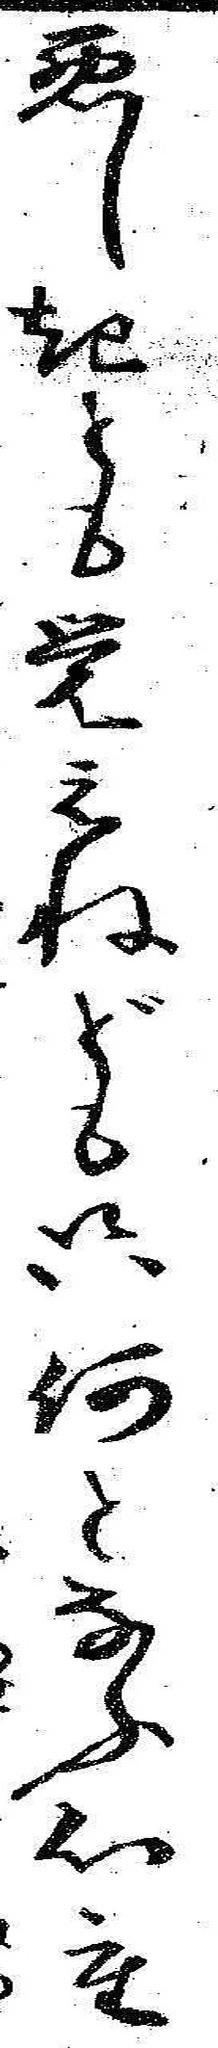悪しきとも覚えねども只何となふ心重
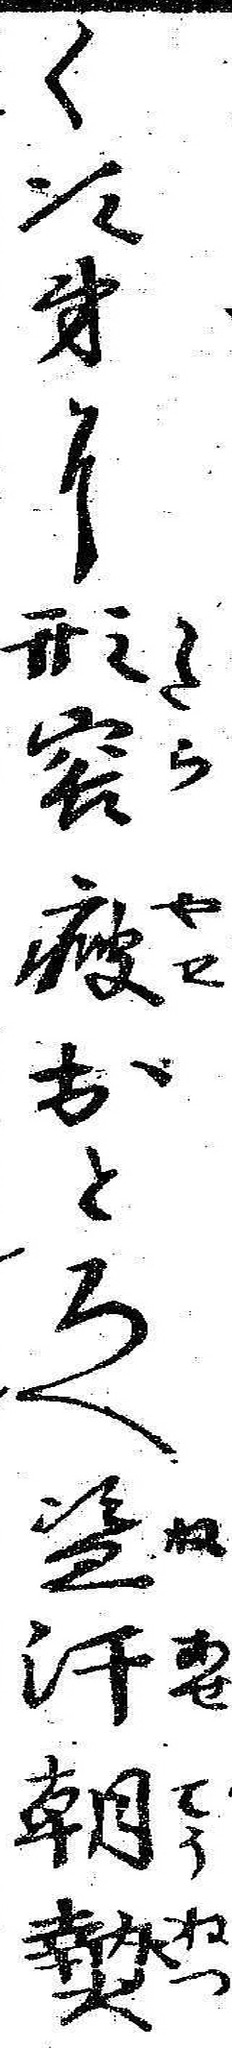く次第に形容痩おとろへ盗汗朝熱
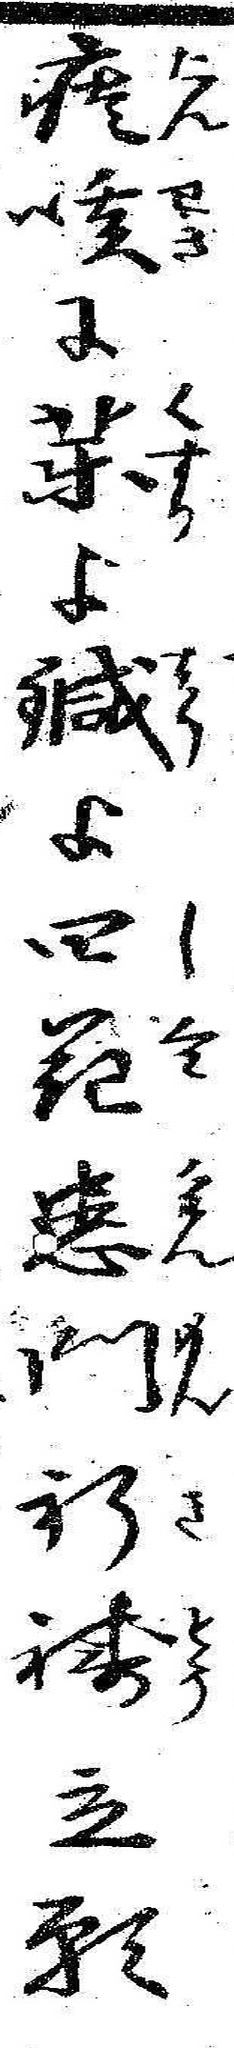痰咳に薬に鍼よ四花患門祈祷立願
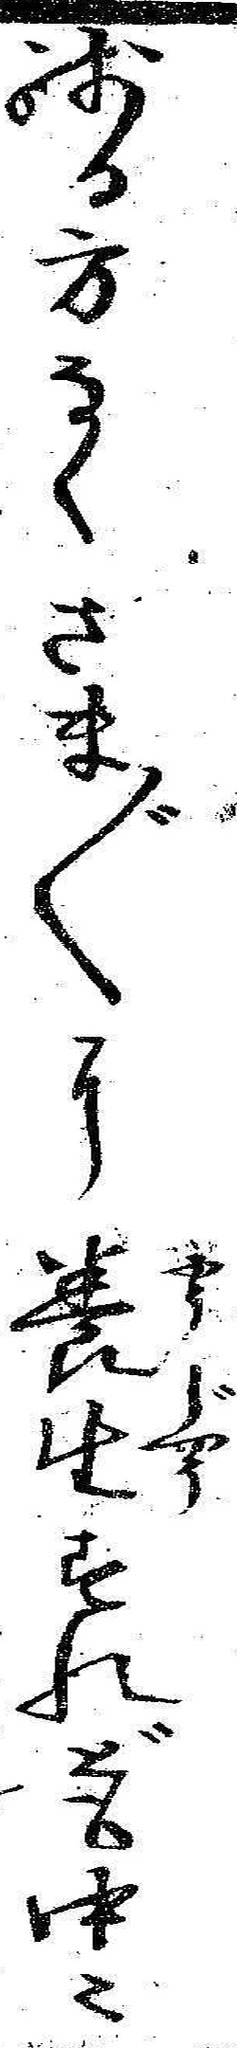残る方なくさま〴〵に養生すれども中々
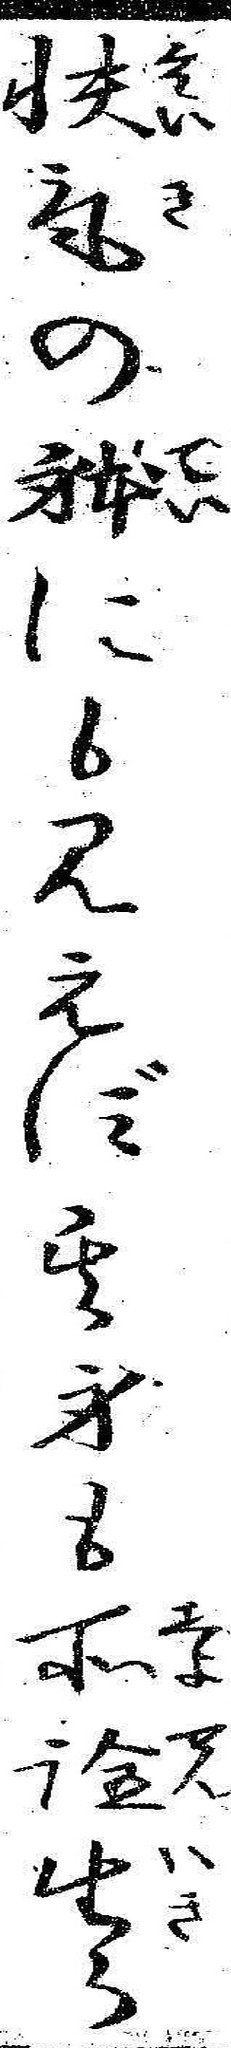快気の体にも見えず其身も所詮生ら
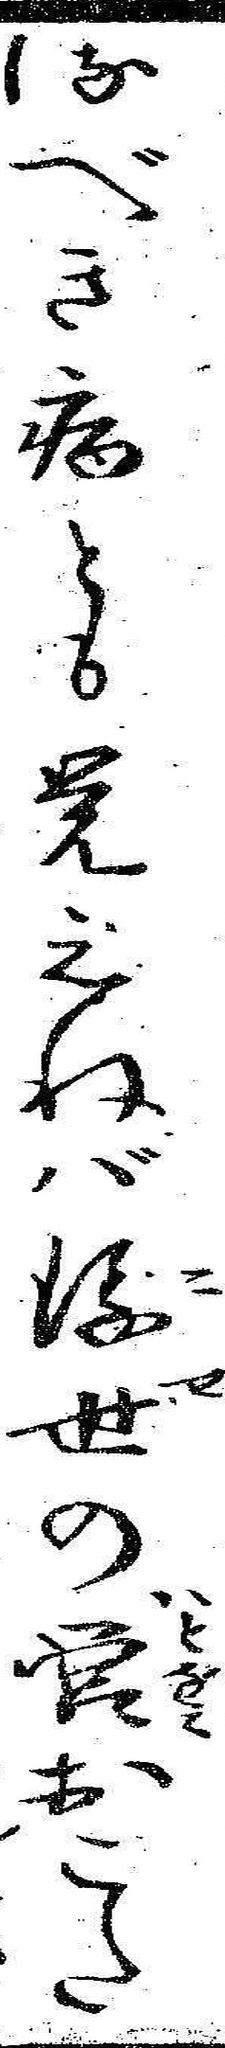るべき病とも覚えねば後世の営おこた
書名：根無草後編
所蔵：国文学研究資料館
